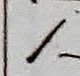1
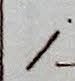1
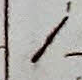1
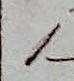1
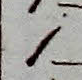1
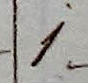1
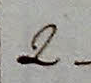2
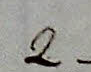2
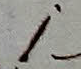1
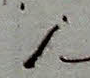1
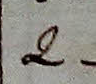2
